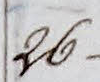26
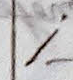1
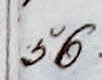56
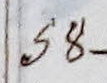58
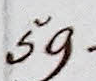59
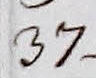37
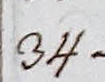34
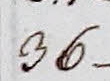36
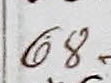68
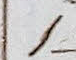1
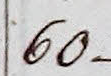60
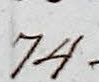74
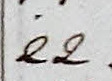22
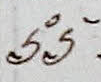55
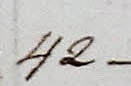42
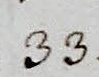33
